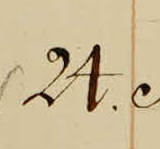24.
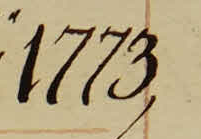1773
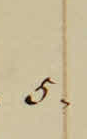5
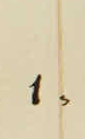1
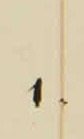1
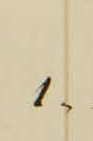1
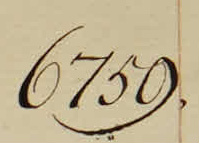6759
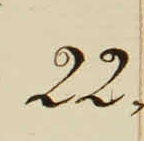22
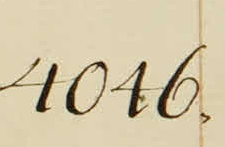4046
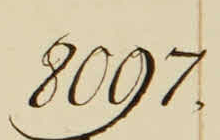8097
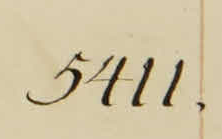5411
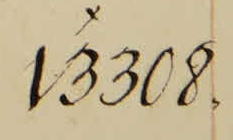13308
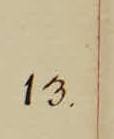13.
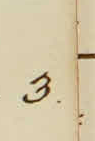3.
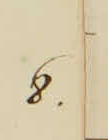8.
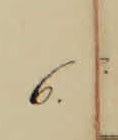6.
